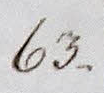63
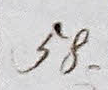58
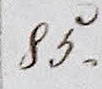85
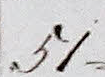51
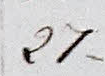27
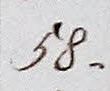58
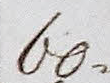60
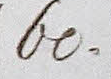60
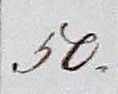50
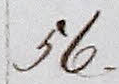56
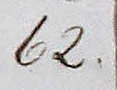62
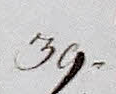39
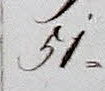51
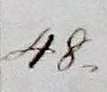48
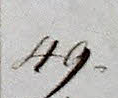49
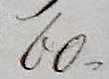60
